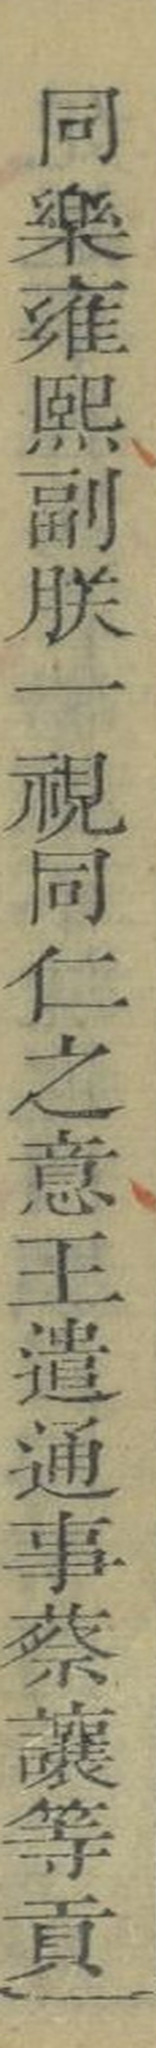同楽雍熙副朕一視同仁之意王遣通事蔡譲等貢
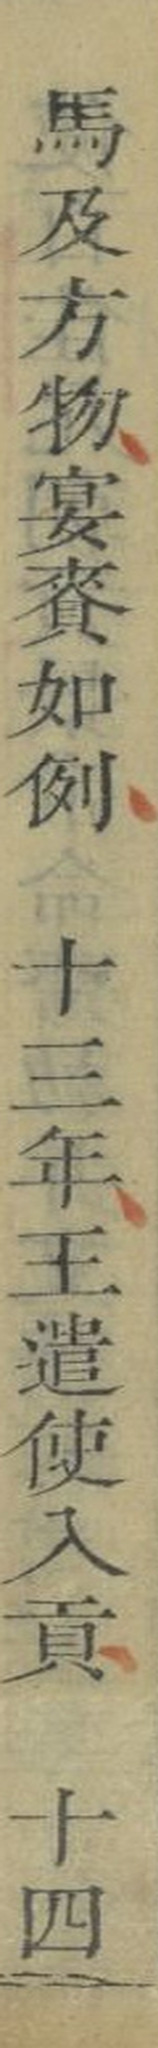馬及方物宴賚如例十三年王遣使入貢十四
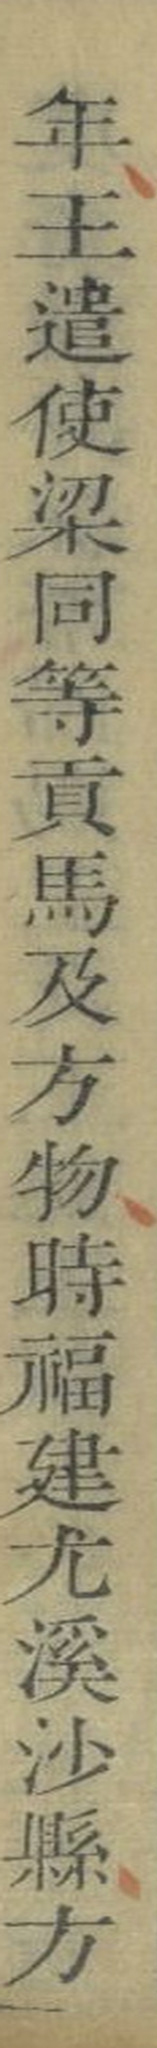年王遣使梁同等貢馬及方物時福建尤渓沙県方
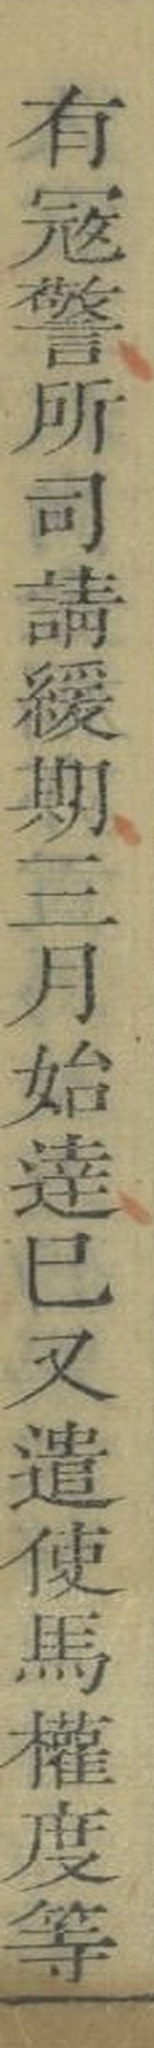有寇警所司請緩期三月始達巳又遣使馬権度等

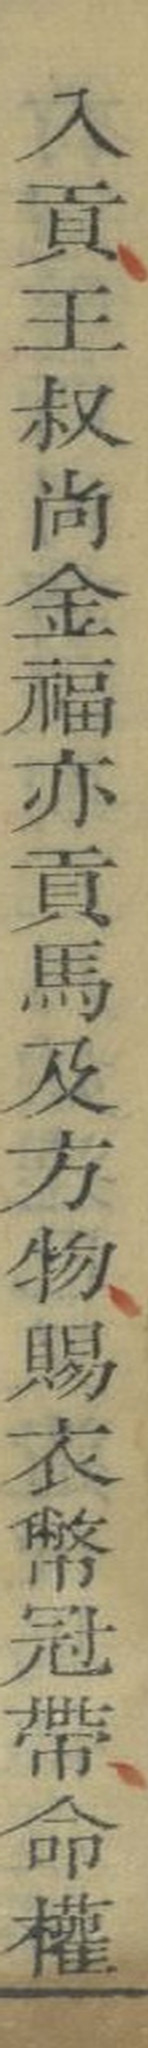入貢王叔尚金福亦貢馬及方物賜衣幣冠帯命権
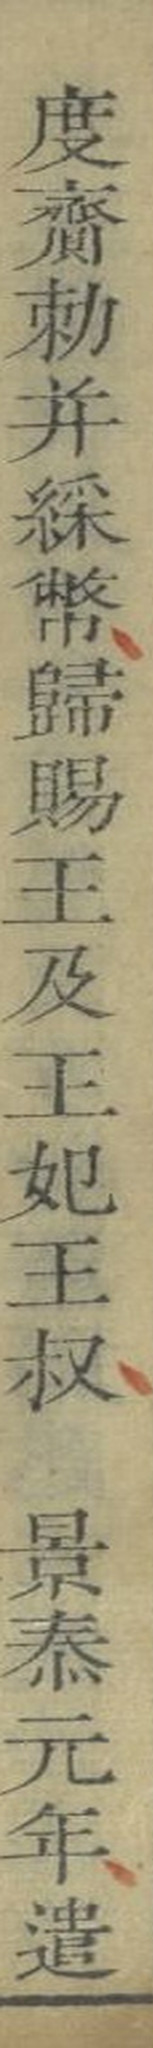度齎勅并綵幣帰賜王及王妃王叔景泰元年遣
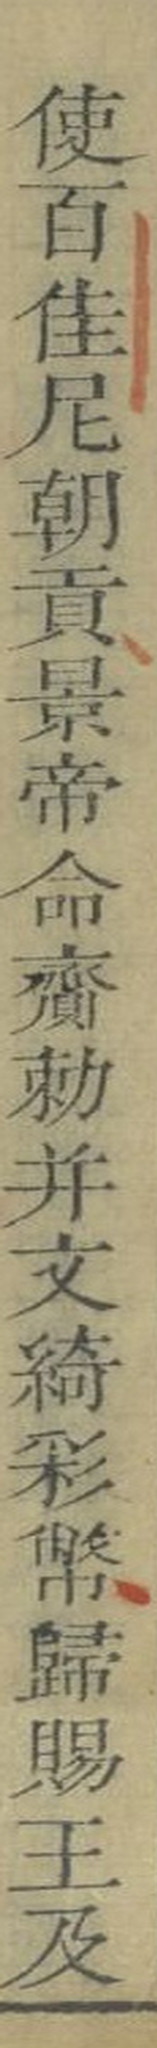使百佳尼朝貢景帝命齎勅并文綺彩幣帰賜王及
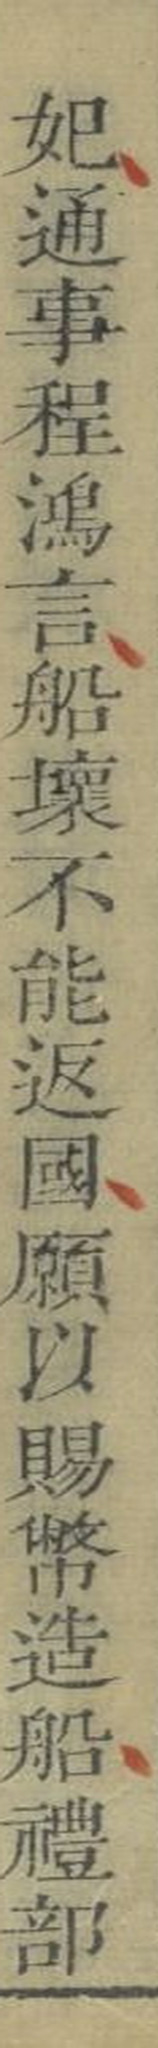妃通事程鴻言船壊不能返国願以賜幣造船礼部
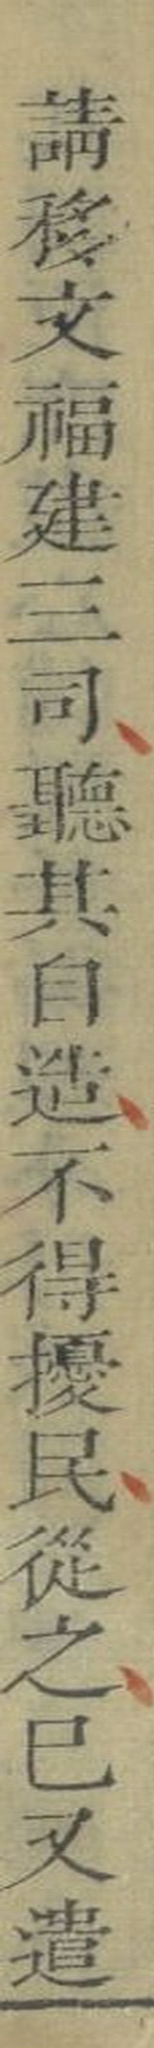請移文福建三司聴其自造不得擾民従之巳又遣
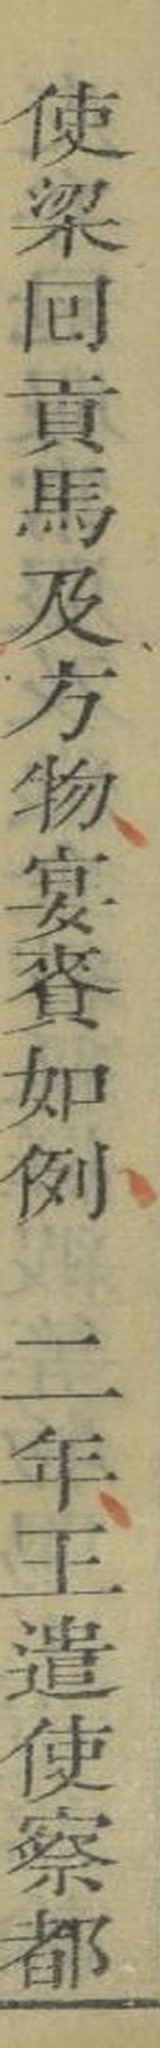使梁回貢馬及方物宴賚如例二年王遣使察都
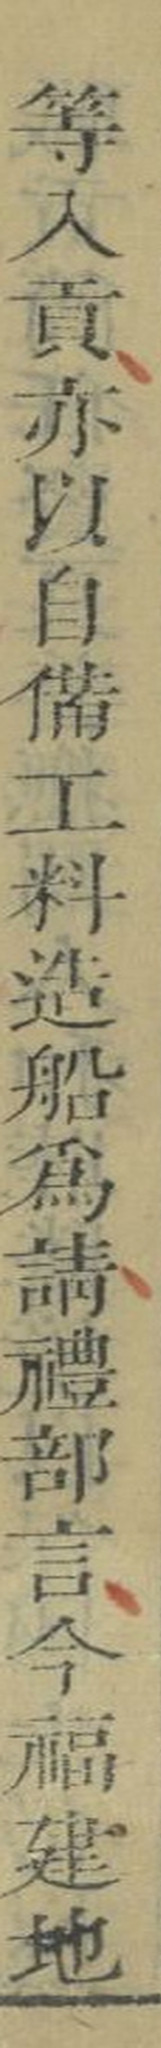等入貢亦以自備工料造船為請礼部言今福建地
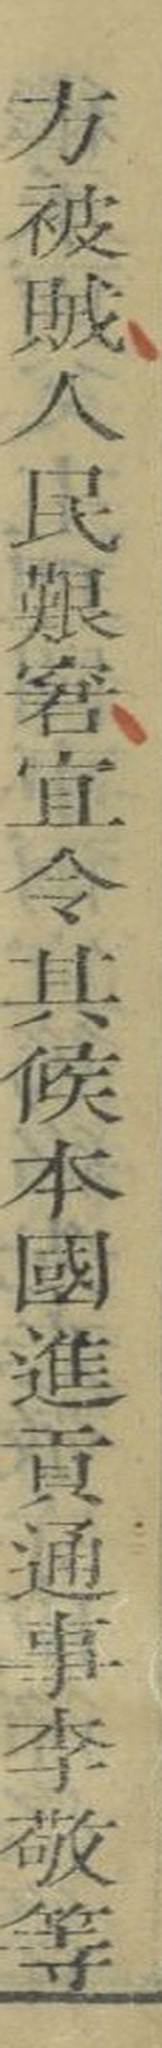方被賊人民艱窘宜令其候本国進貢通事李敬等
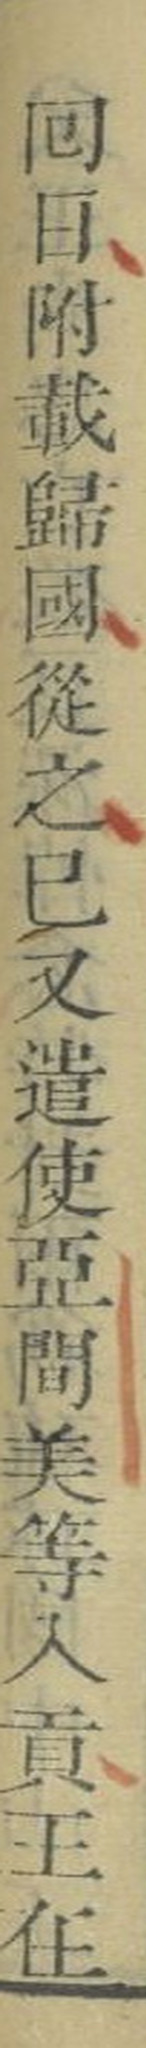回日附載帰国従之巳又遣使亜間美等入貢王在
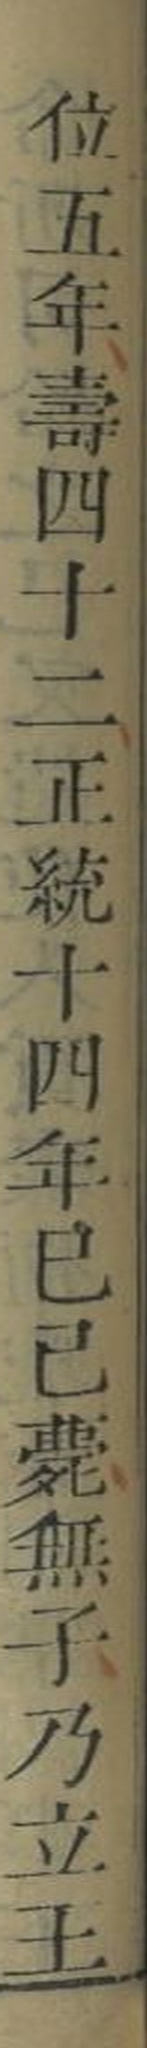位五年寿四十二正統十四年巳已薨無子乃立王
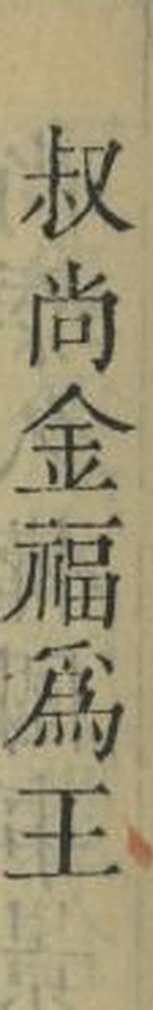叔尚金福為王
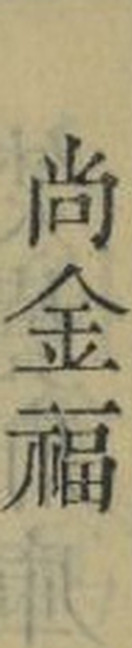尚金福
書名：中山伝信録 巻三
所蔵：University of the Ryukyus Library
